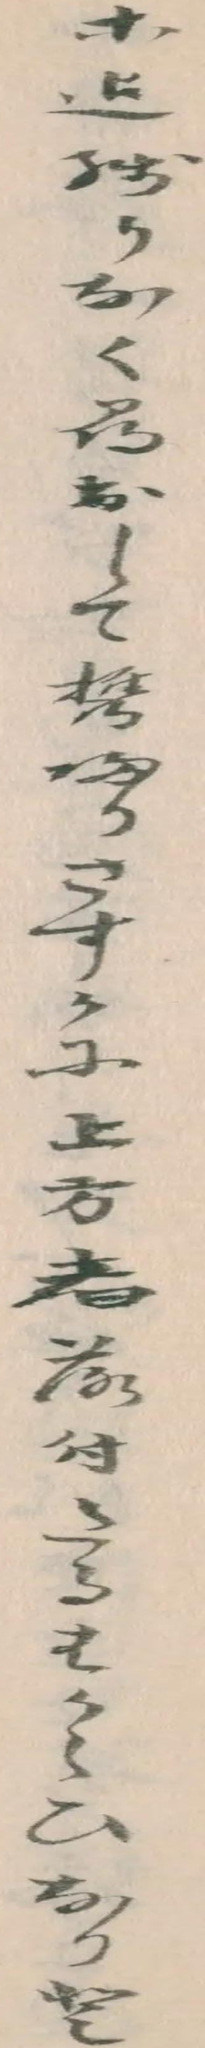等迄残りなく尋出して携帰りさすかに上方者落付たるはからひなりと
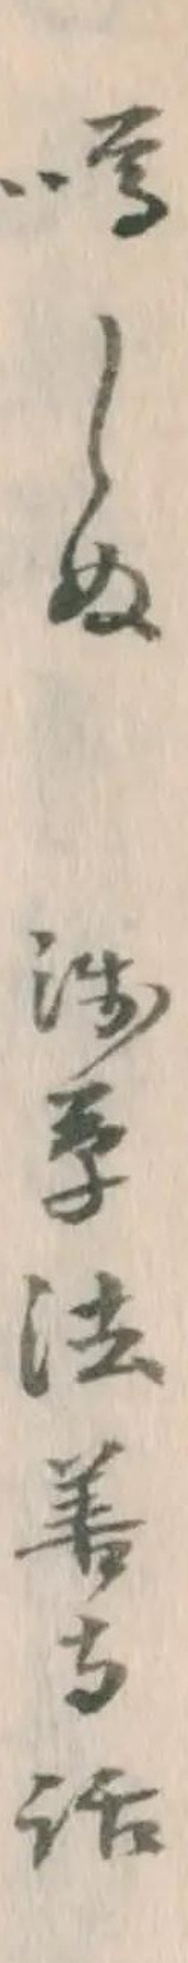噂しぬ浅草法善寺話
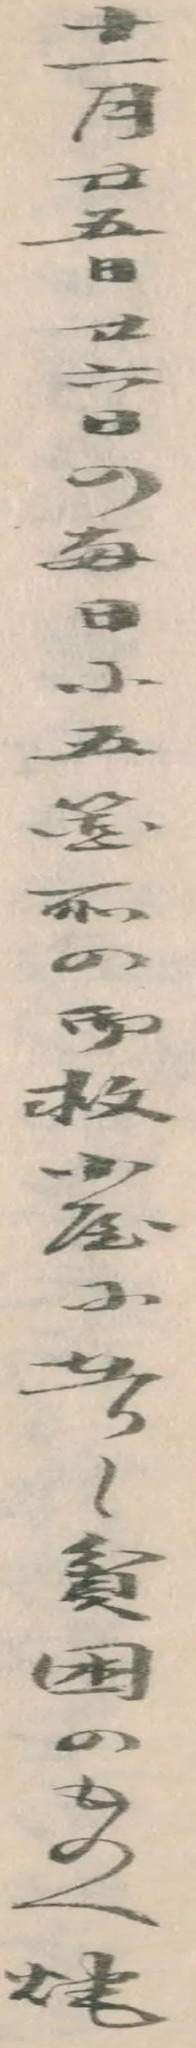十一月廿五日廿六日の両日に五箇所御救小屋に在りし貧困のものへ焼

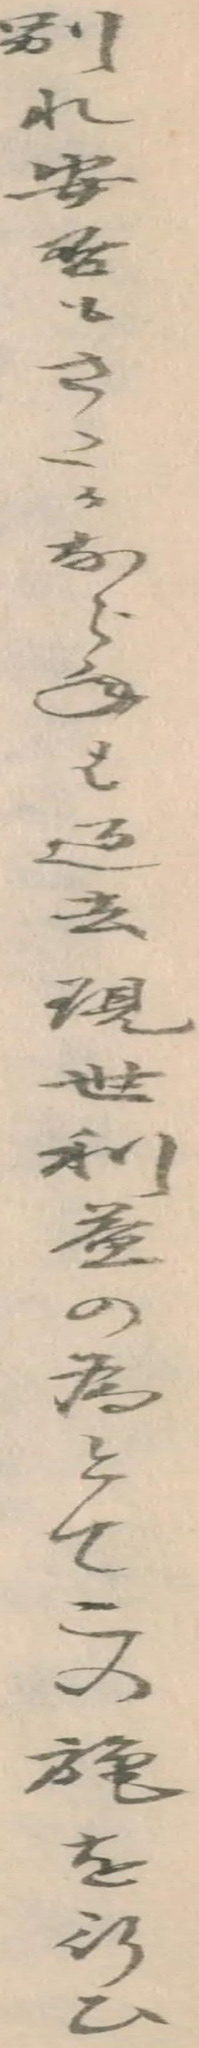別れ安否もさたかならねは過去現世利益の為とてこの施を行ひ
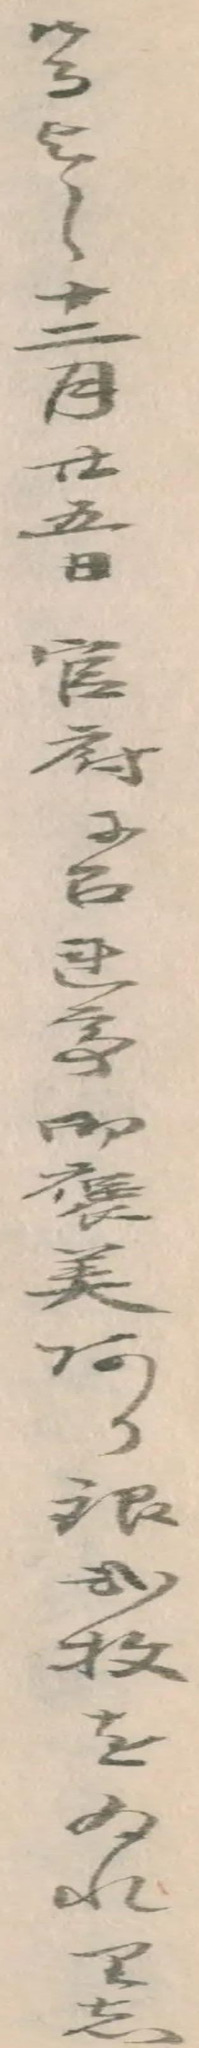けるよし十二月廿五日官府に召れて御褒美あり銀弐枚を給れりし
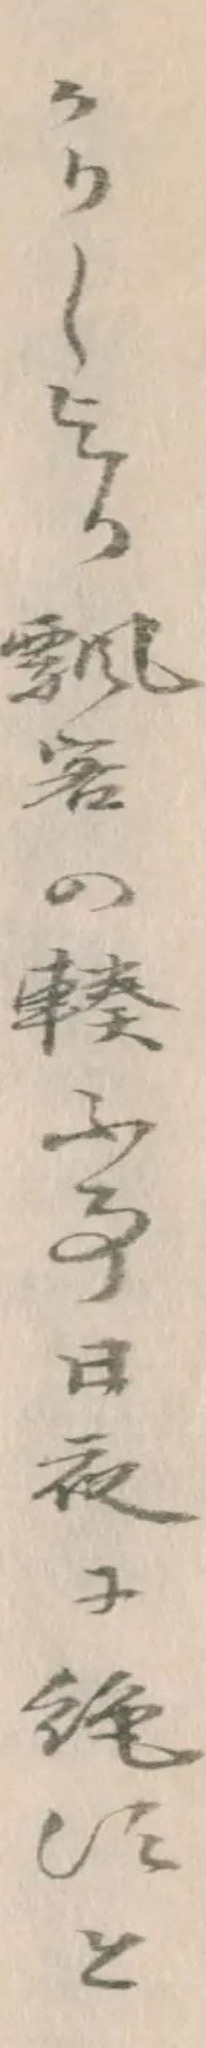かりしより瓢客の輳ふ事日夜に絶すと
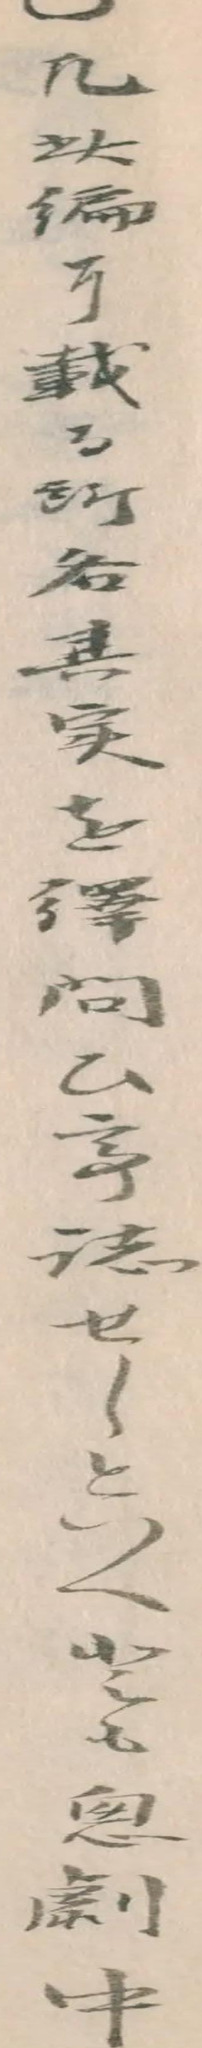〇凡此編に載る所各其実を繹問ひて誌せしといへとも悤劇中
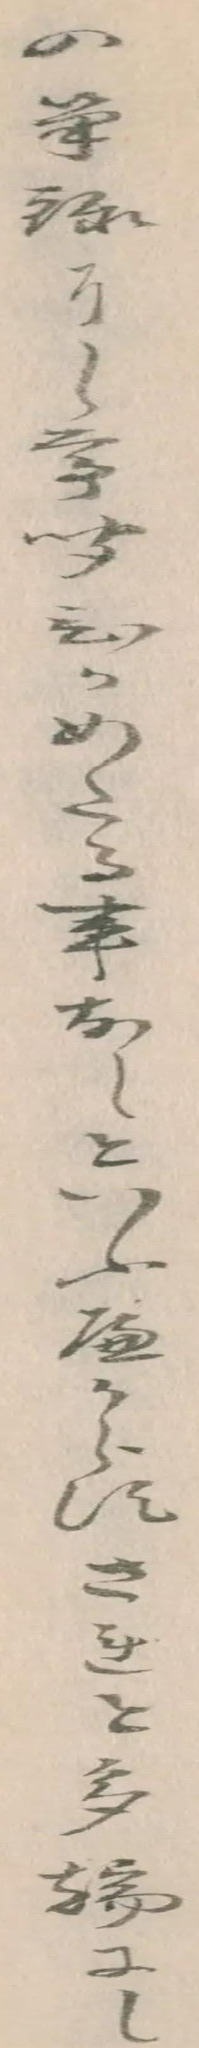の筆録にして聞ひかめたる事なしといふへからすされと多端にし
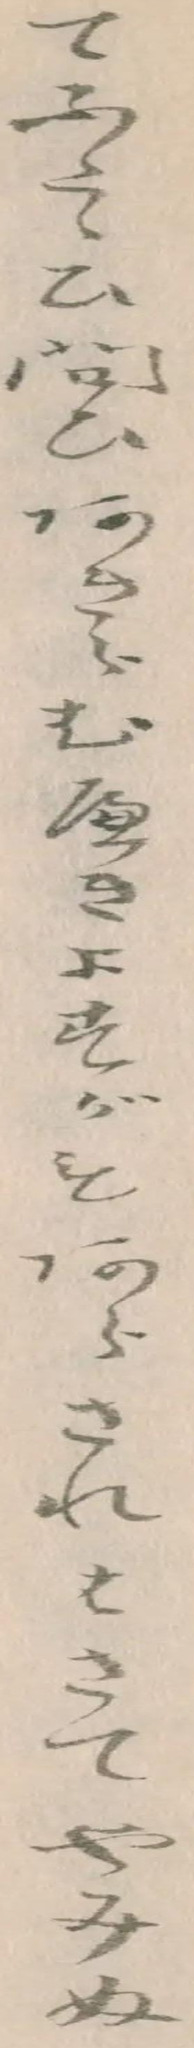てふたゝひ問ひあきらむへきよすがもあらされはさてやみぬ
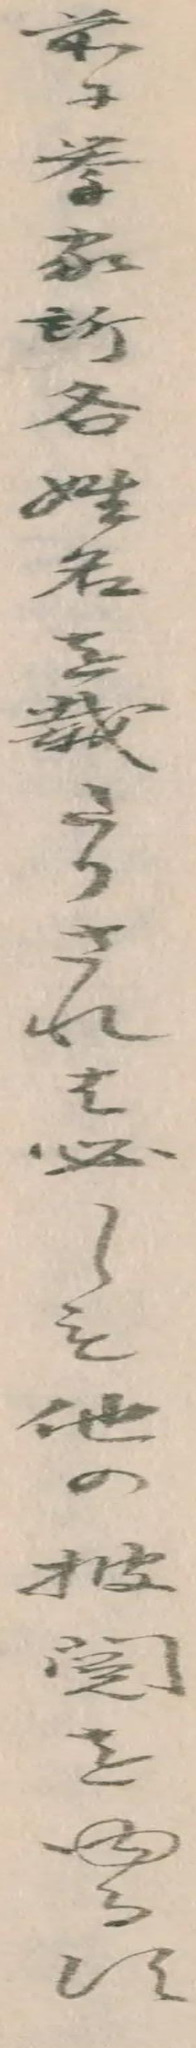前に挙家所各姓名を載たりされは必しも他の披閲をゆるす
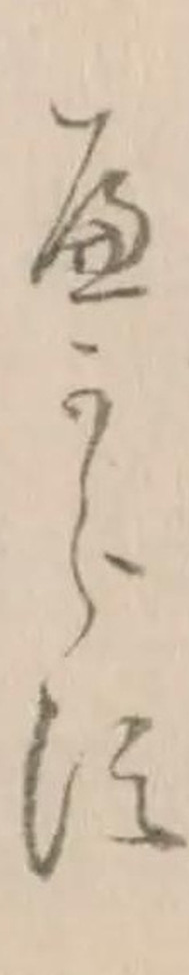へからす
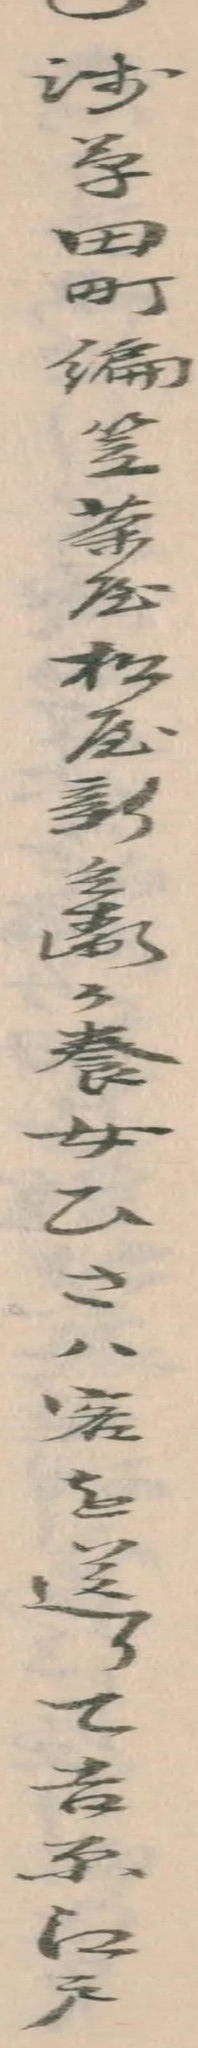〇浅草田町編笠茶屋松屋新兵衛か養女ひさは客を送りて吉原江戸
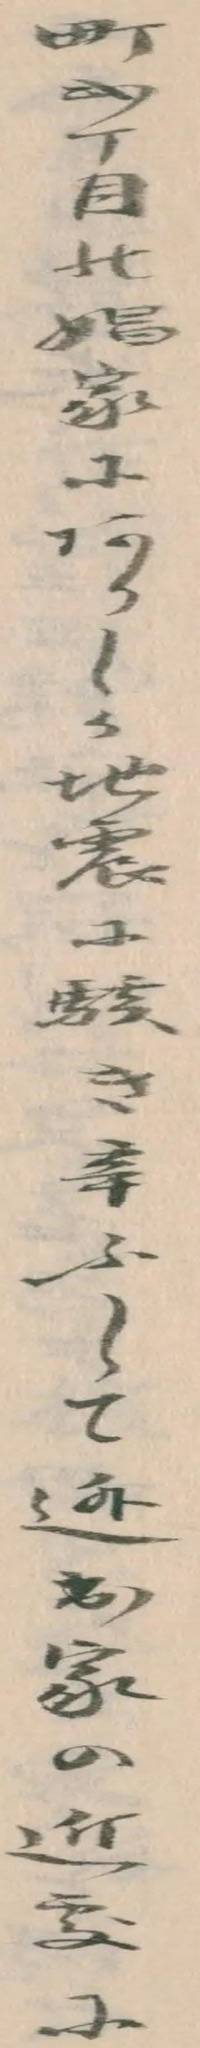町弐丁目の娼家にありしか地震に駭き辛ふして逃出家の近処に
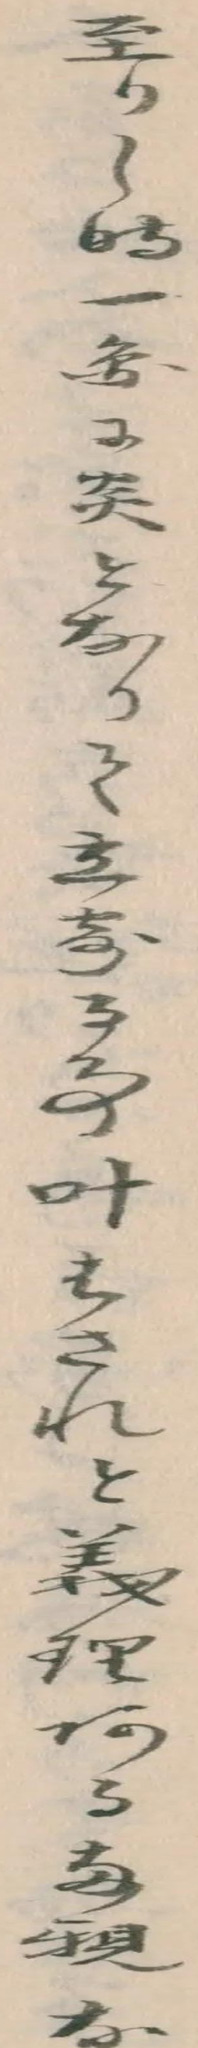至りし時一円に炎となりて立寄る事叶はされと義理ある両親な
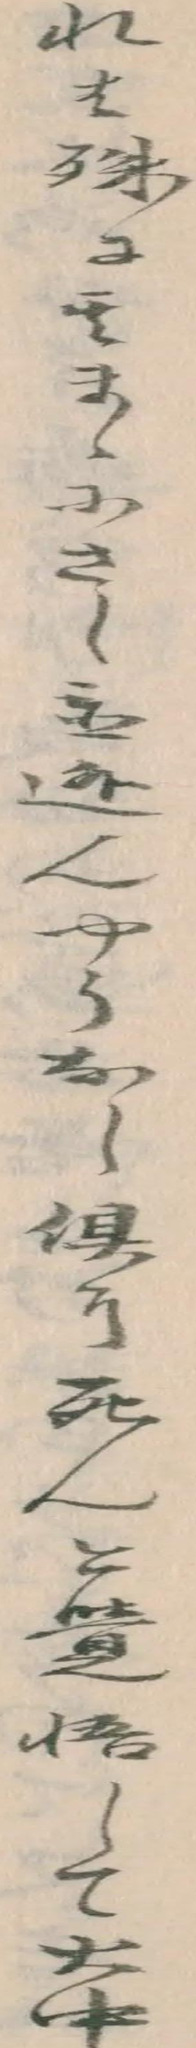れは殊に其まゝにさし置逃んやうなし倶に死んと覚悟して火中
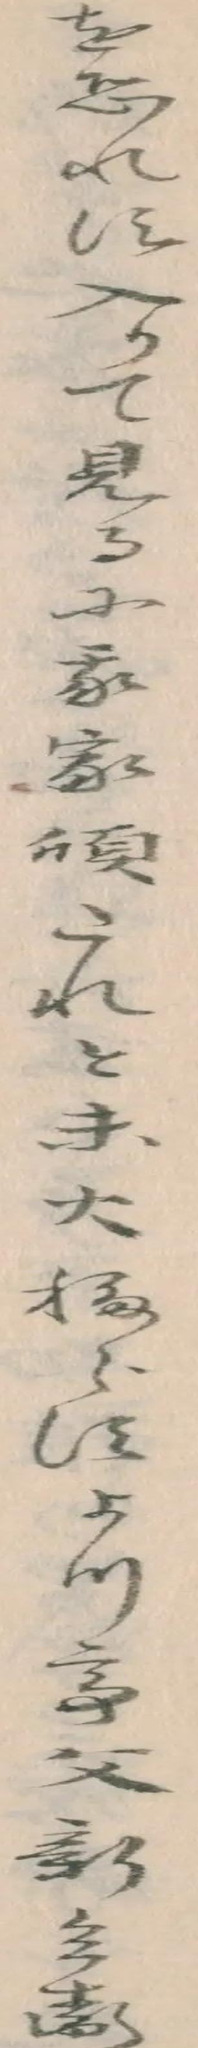を恐れす入りて見るに我家傾たれと未火移らすよつて父新兵衛
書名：地災撮要. 巻10(地震之部) 上,下
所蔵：国立国会図書館 National Diet Library, JAPAN
